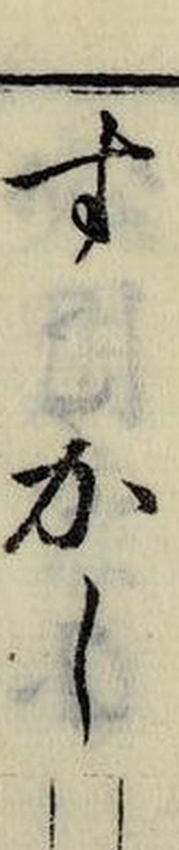すかし
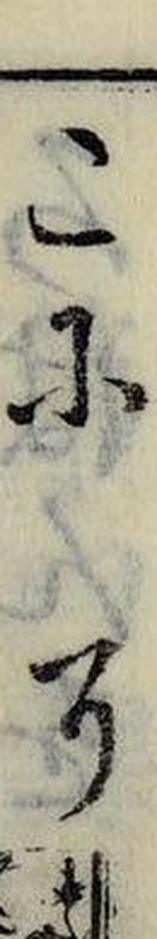こにそ

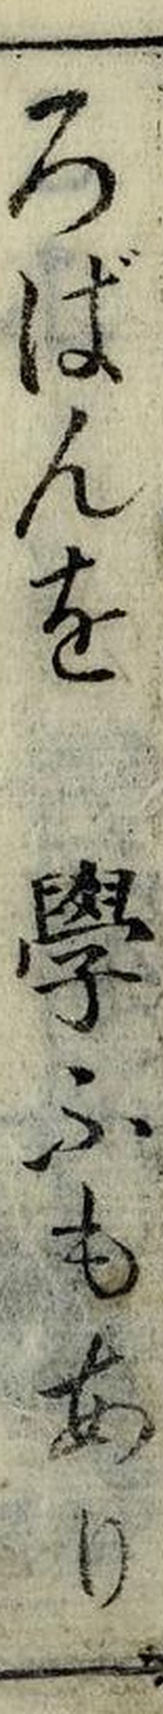ろばんを学ふもあり
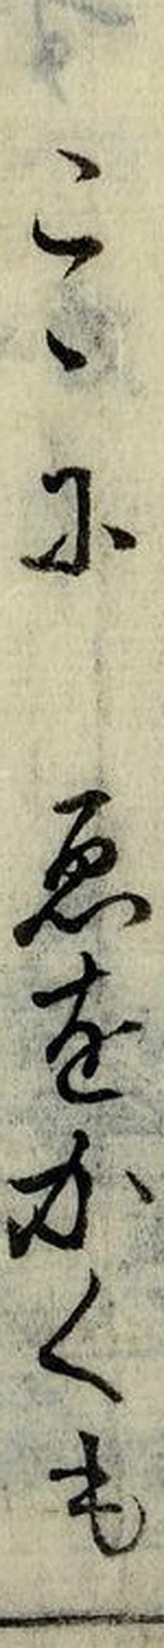こゝにゑをかくも
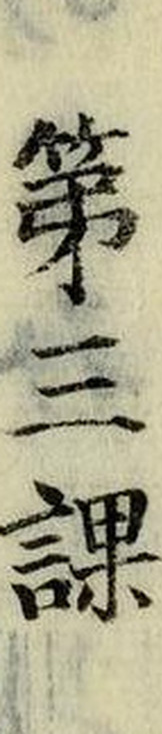第三課
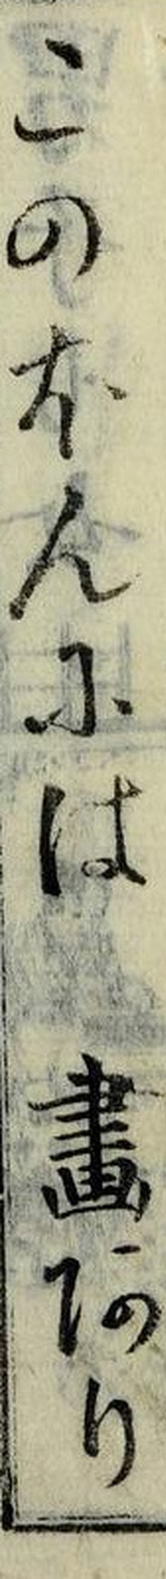このほんには画あり
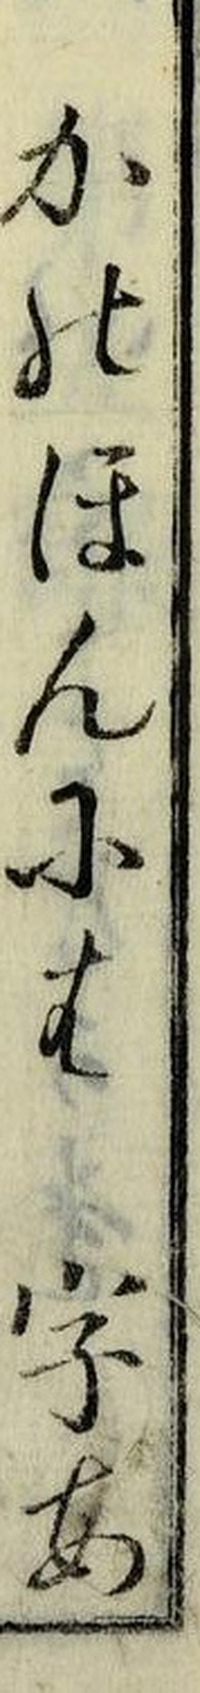かのほんには字あ
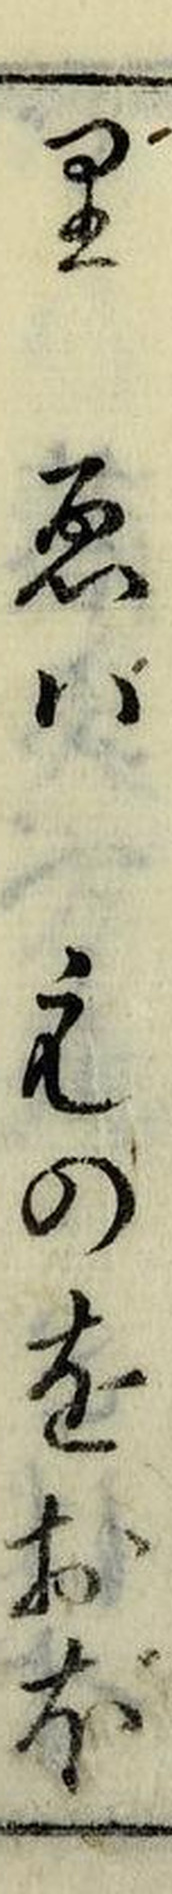りゑはものをおぼ
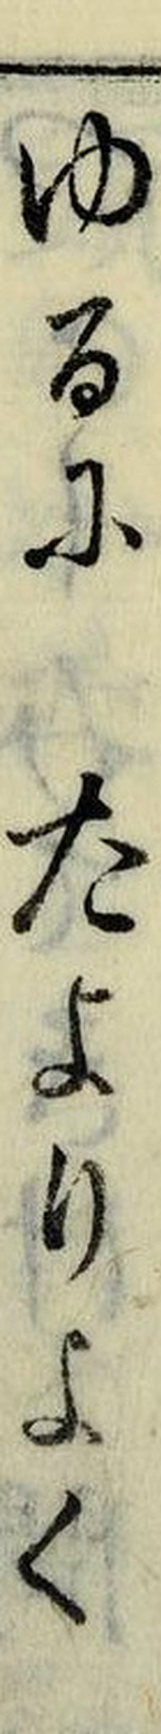ゆるにたよりよく
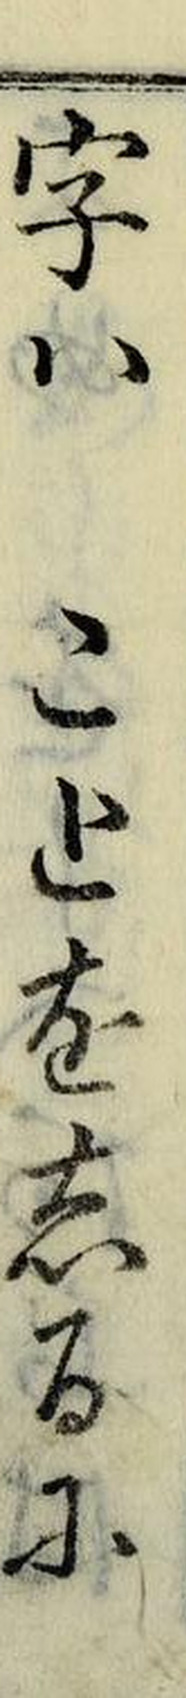字はことをしるに
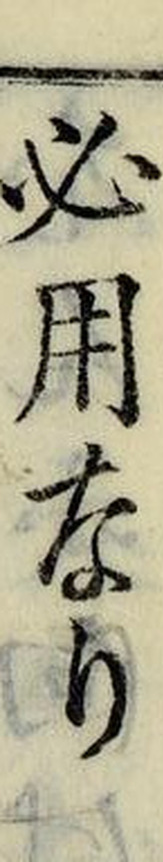必用なり
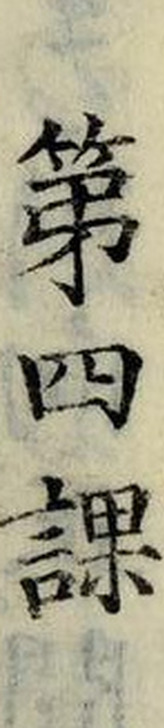第四課

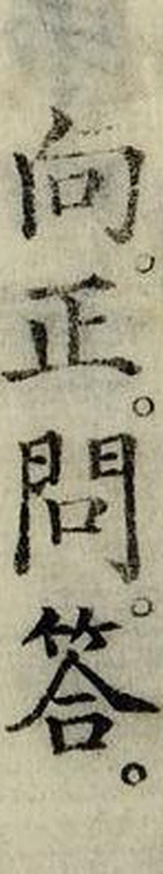向。正。問。答。
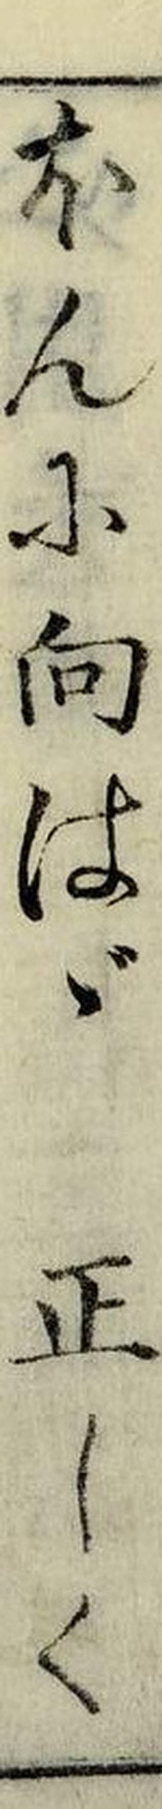ほんに向はゞ正しく
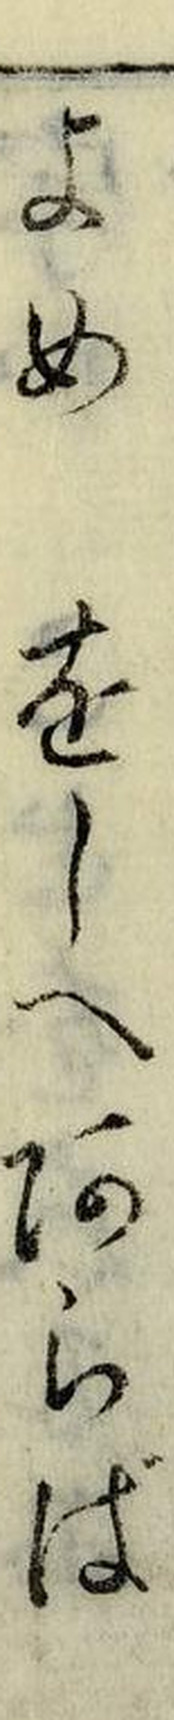よめをしへあらば
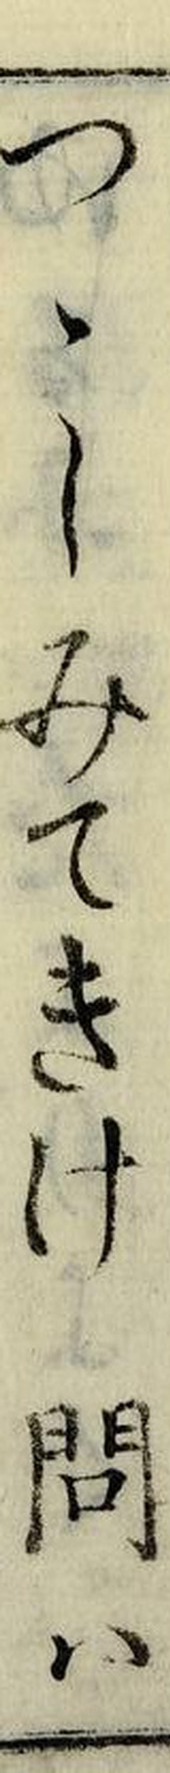つゝしみてきけ問は
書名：小学読本 初等科 巻一
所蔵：福井県文書館 Fukui Prefectural Archives
